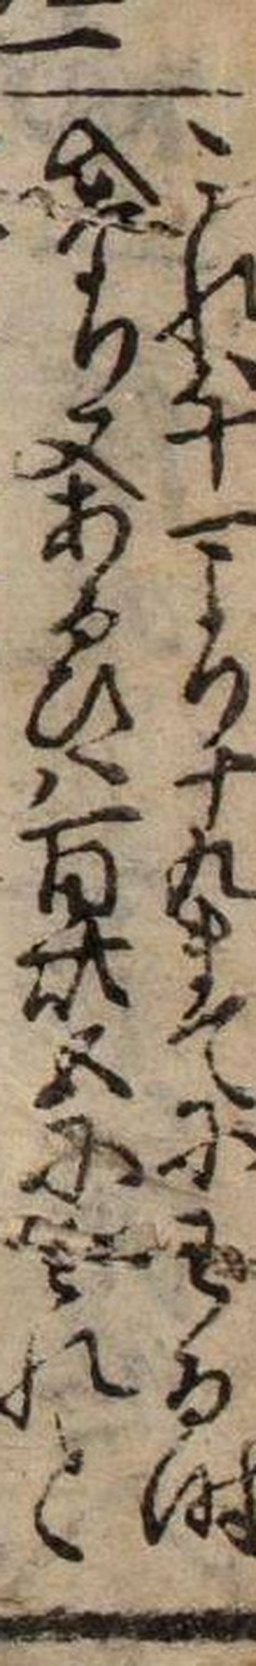入なり又あるひは百二十五にわれと
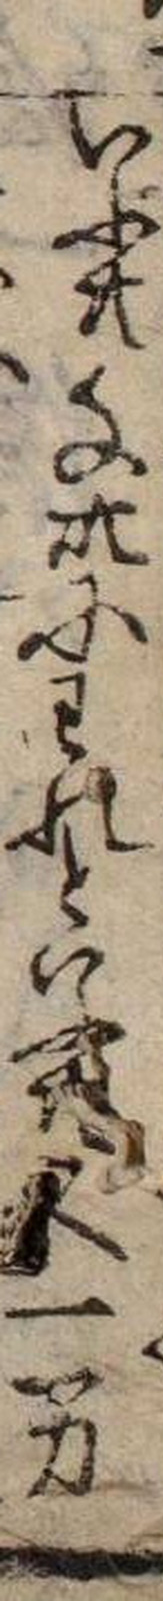いふ共千共われといふ共又一万
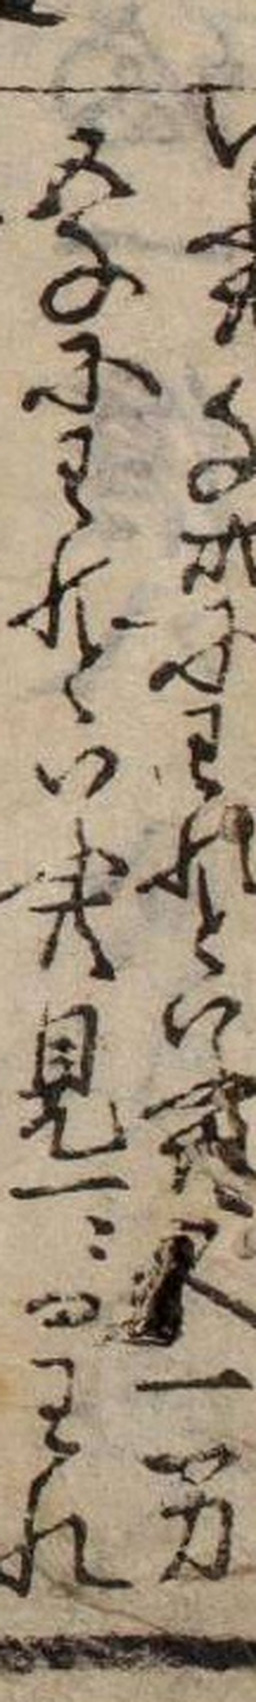五千にわれといふ共見一にてわれ
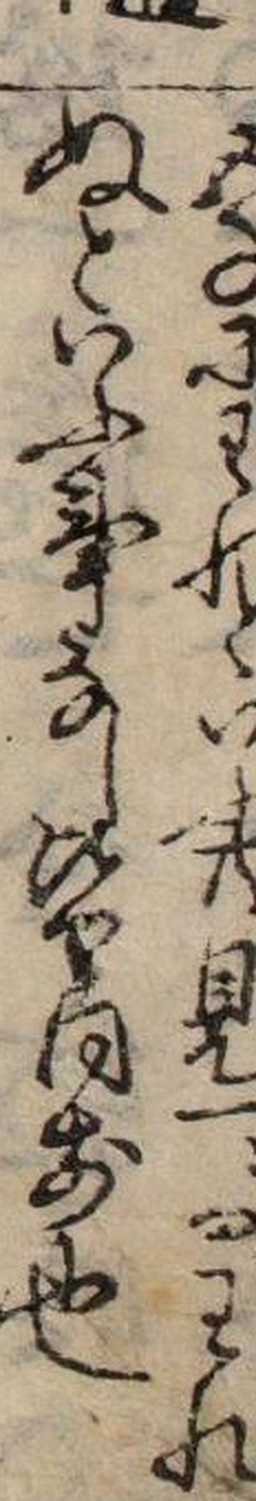ぬといふ事なし此や同前也
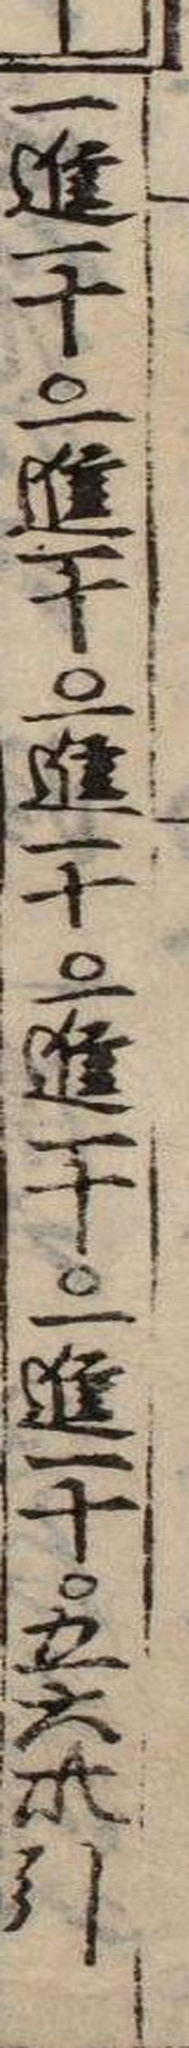分一進一十○一進一十○一進一十○一進一十○一進一十○五六卅引
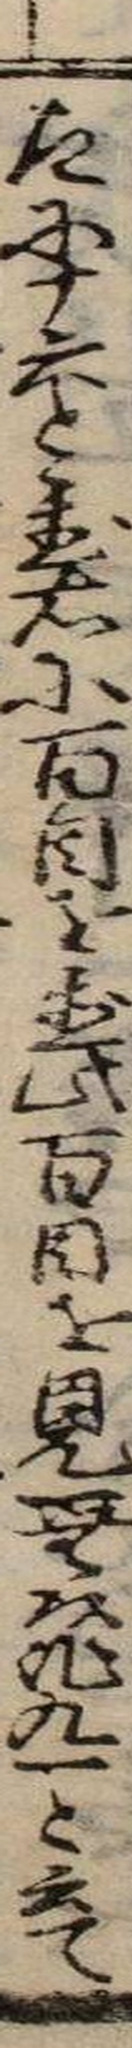右に十六と置右に百目を置此百目を見一無頭作九一と云て
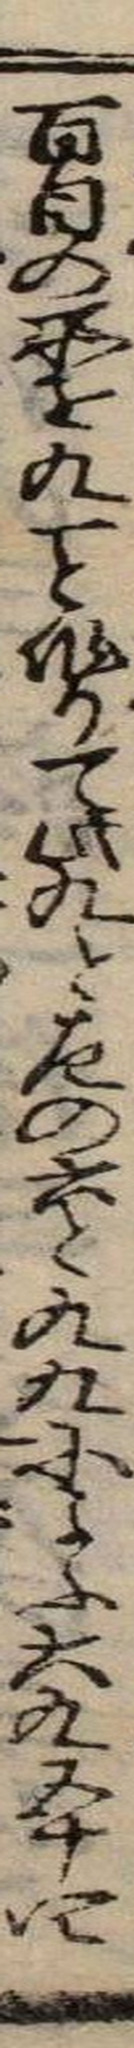百目の所を九一と作りて此九と左の六と九九によふ六九五十四
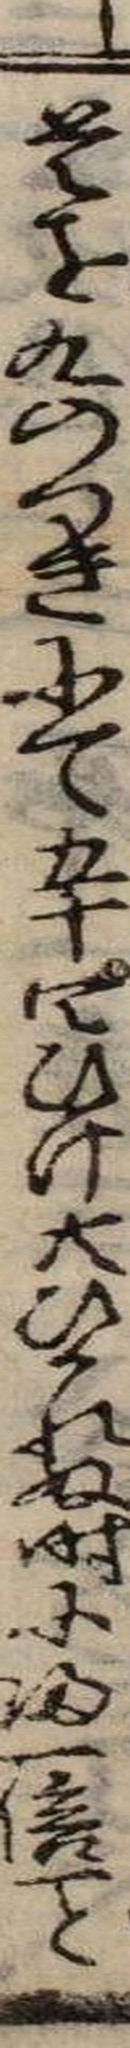六是を九のつきにて五十四ひけ共ひかれぬ時に帰一倍一と
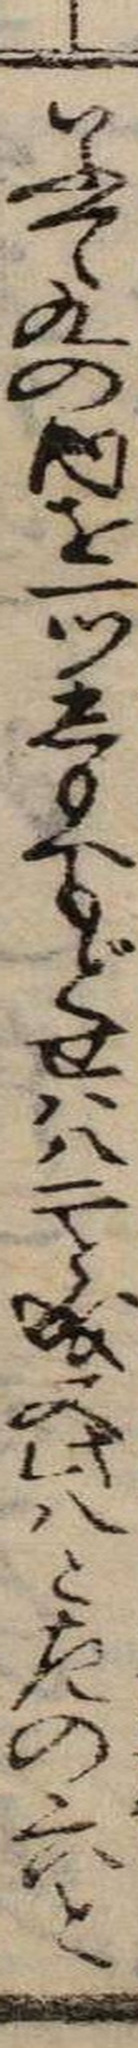一十いふて九の内を一つしもへもどせは八二と成又此八と左の六と
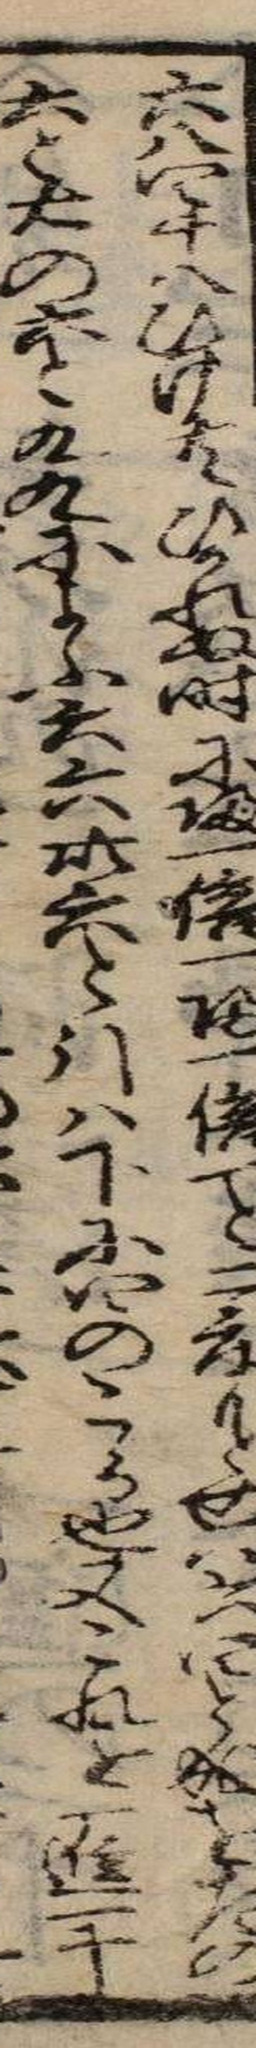六と共の六と九九によふ六六卅六と引は下に四のつくる也又これと一進一十
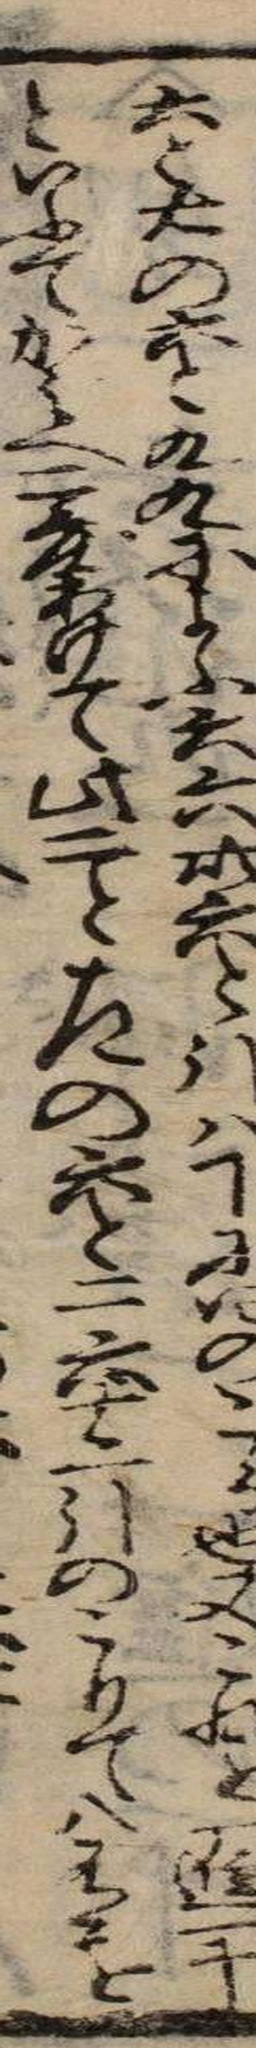といふてかみへ二度あけて此二と左の六と二六十二引のこりて八有を
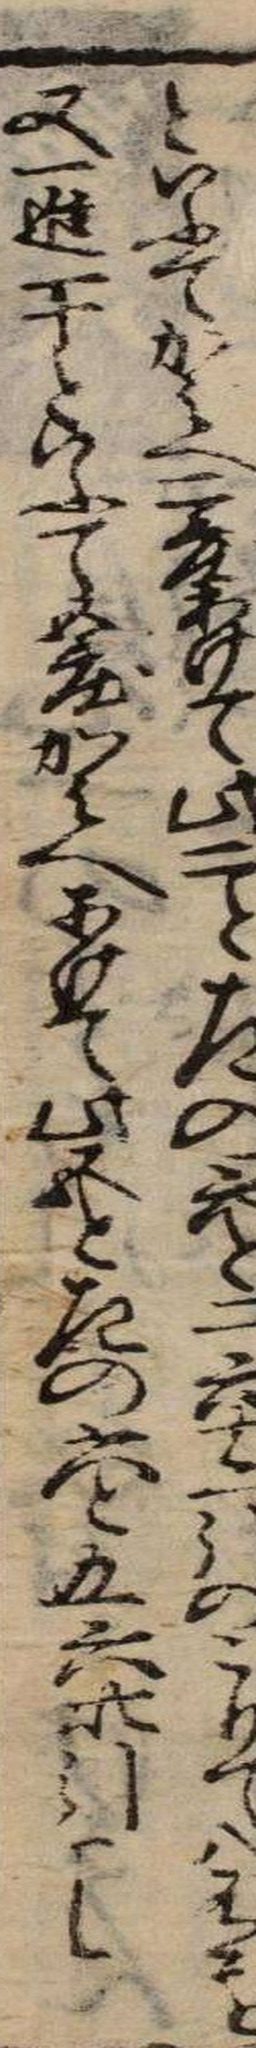又一進一十といふて五度かみへあけて此五と左の六と五六卅引也
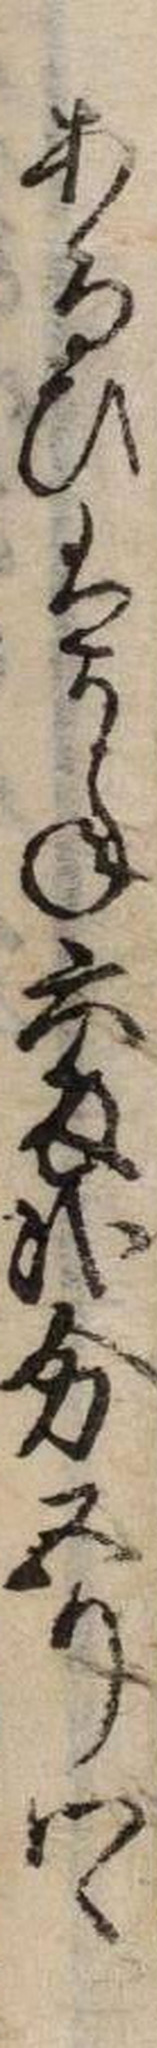あるひはかね六匁弍分五りつつ
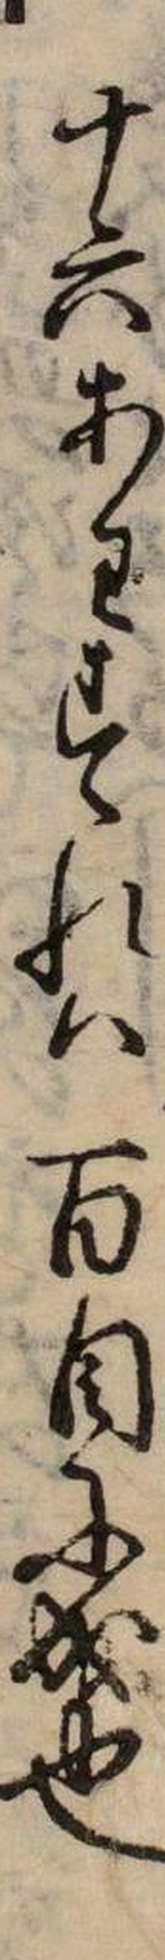十六あわすてれは百目に成也
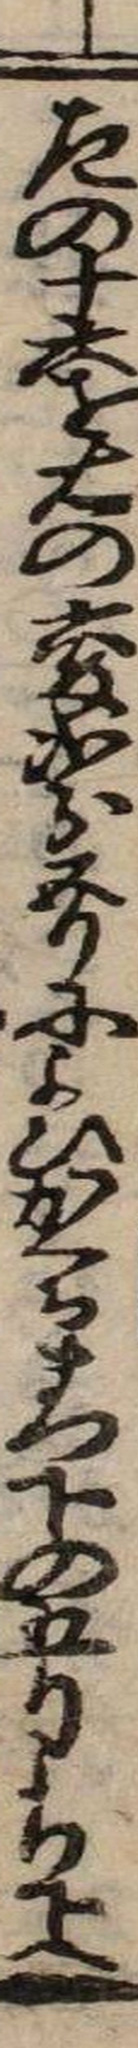左の十六を右の六匁弍分五りによひかくるまつ下の五りより下へ
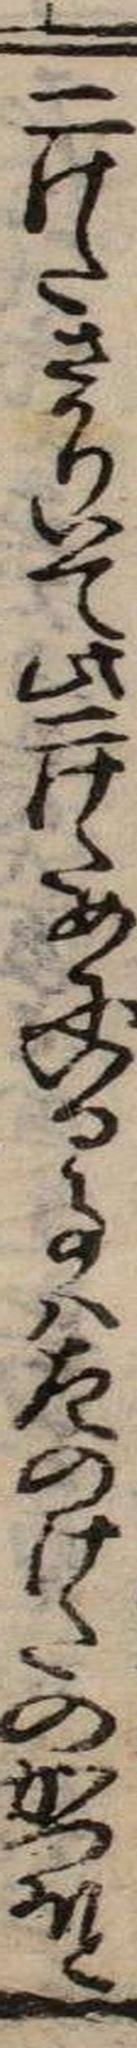二けたさかりいて此二けためにいる事は左のけたのかつほと
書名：塵劫記（寛永11年自跋、京都府立京都学・歴彩館追貴8）
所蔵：京都府立京都学・歴彩館 国文学研究資料館
